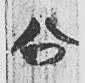公
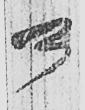乃
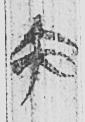內
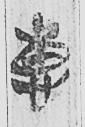惠
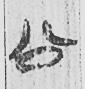公
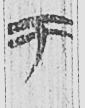于
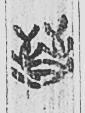晉
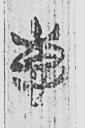惠
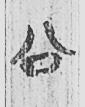公
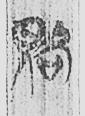賂
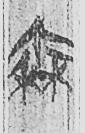秦
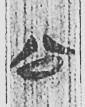公
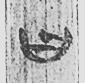曰
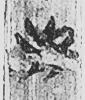我
